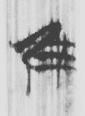隹
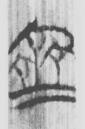齊
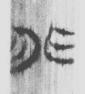非
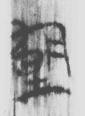{土旬}
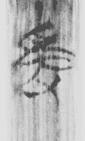{爯又}
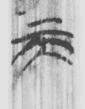而
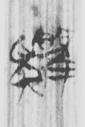{爯雚}
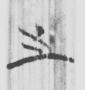之
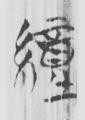{糸童}
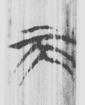而
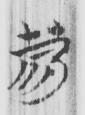葲
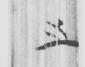之
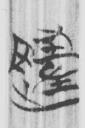{隓止}
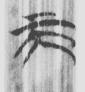而
